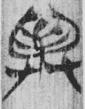與
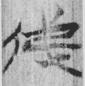俤（弟）
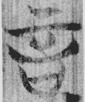言言
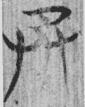丞（承）
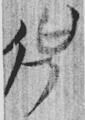○（兄）
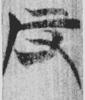反
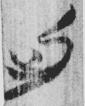此
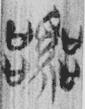○（亂）
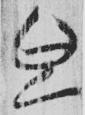也
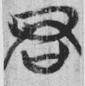君
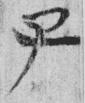子
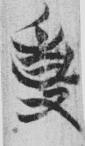事
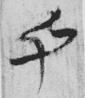父
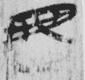母（母）
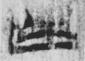亡（無）
